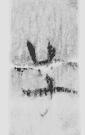{廿七}
